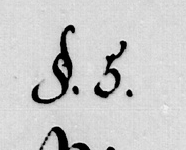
§. 5.
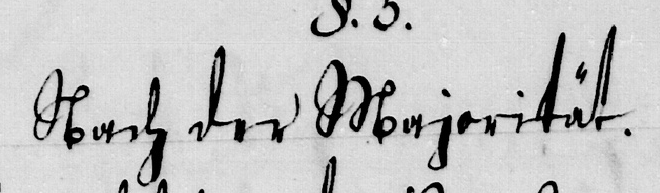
Nach der Majorität.
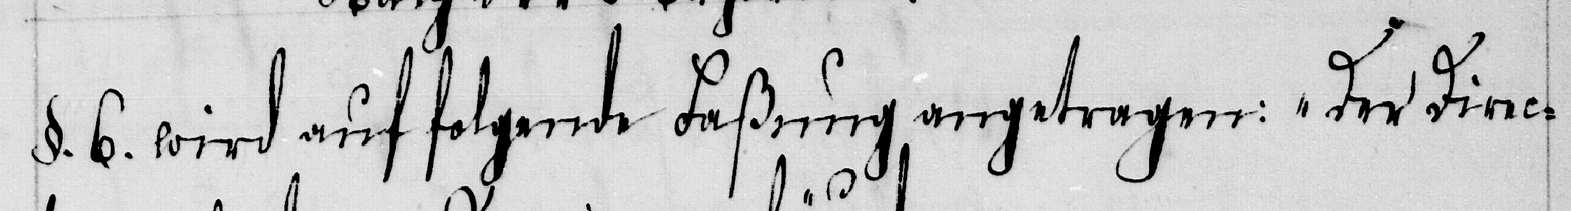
§. 6. wird auf folgende Faßung angetragen: „Der Direc¬
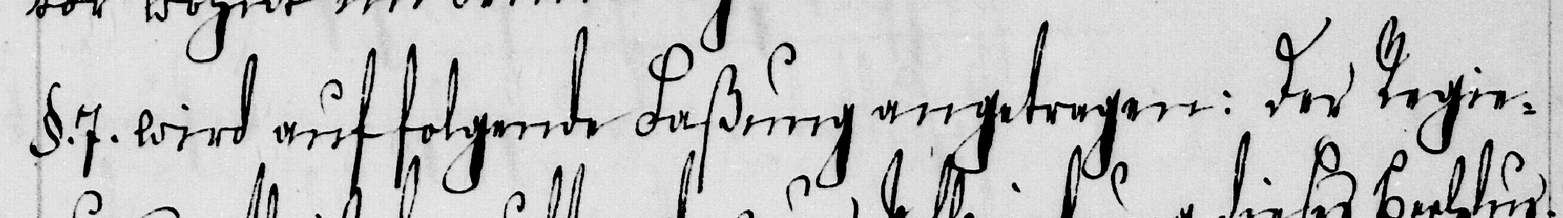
7. wird auf folgende Faßung angetragen: Der Regie¬
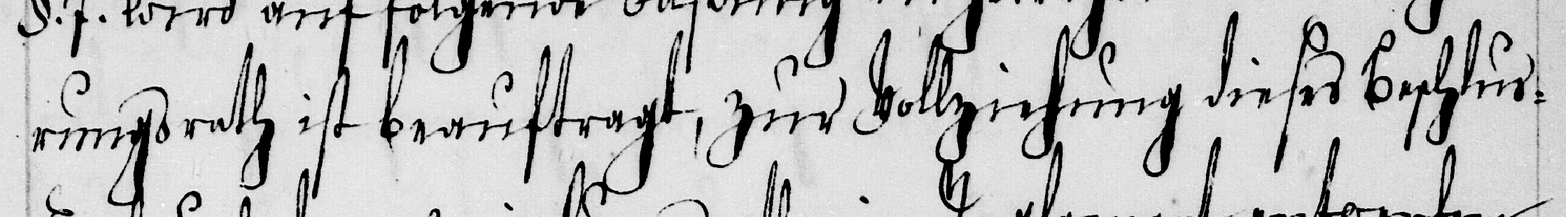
rungsrath ist beauftragt, zur Vollziehung dieses Beschluß¬
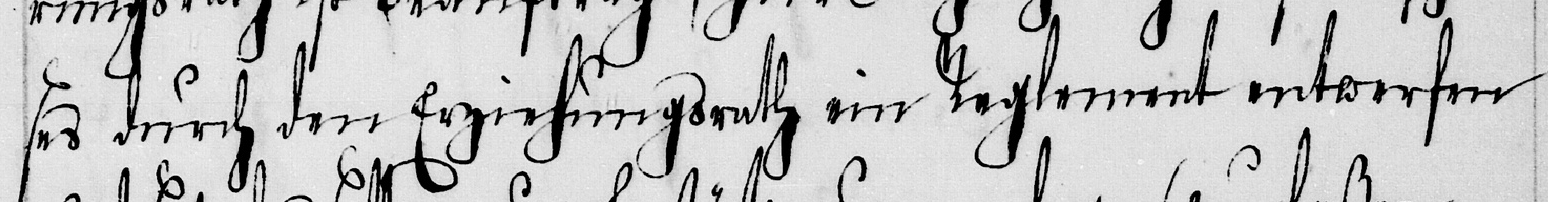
es durch den Erziehungsrath ein Reglement entwerfen
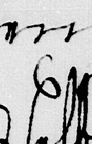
§.
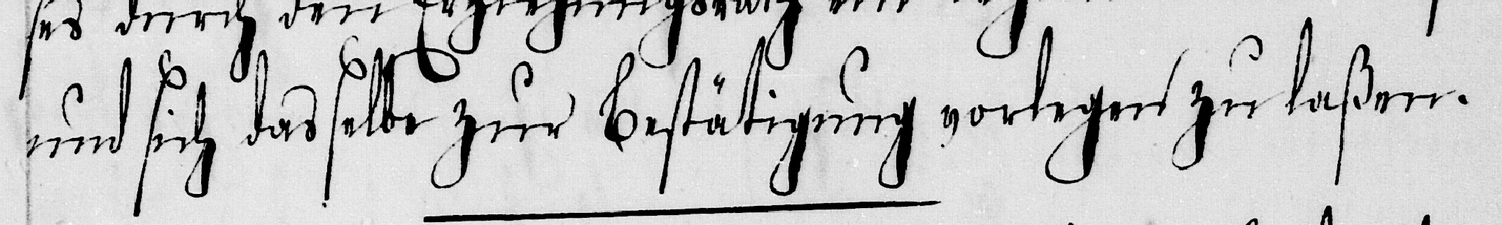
und sich dasselbe zur Bestätigung vorlegen zu laßen.
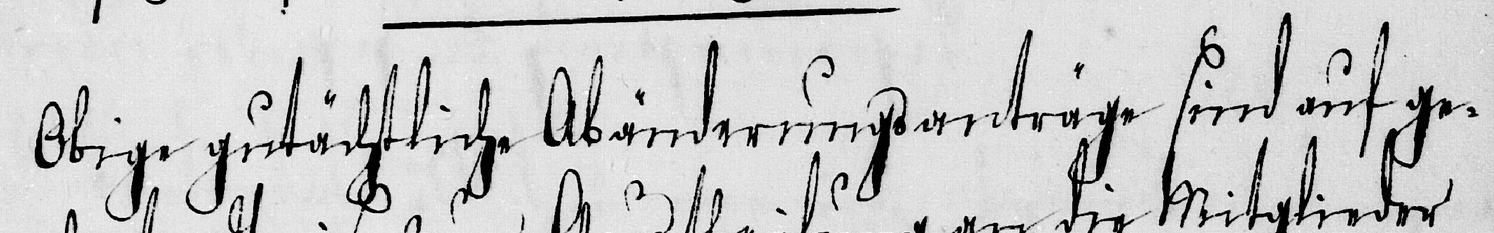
Obige gutächtliche Abänderungsanträge sind auf ge¬
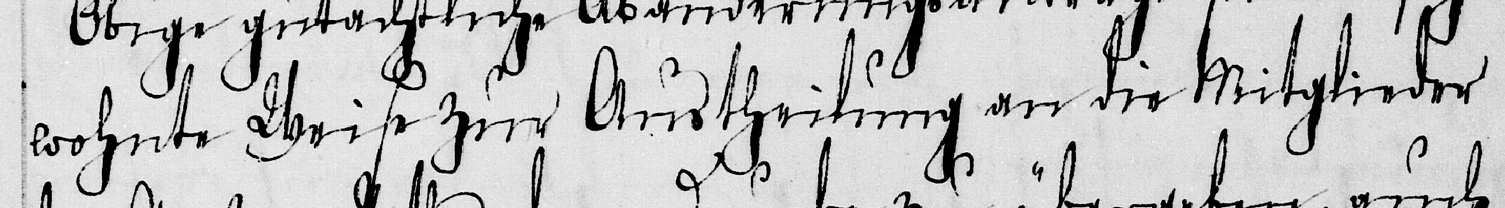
wohnte Weise zur Austheilung an die Mitglieder
